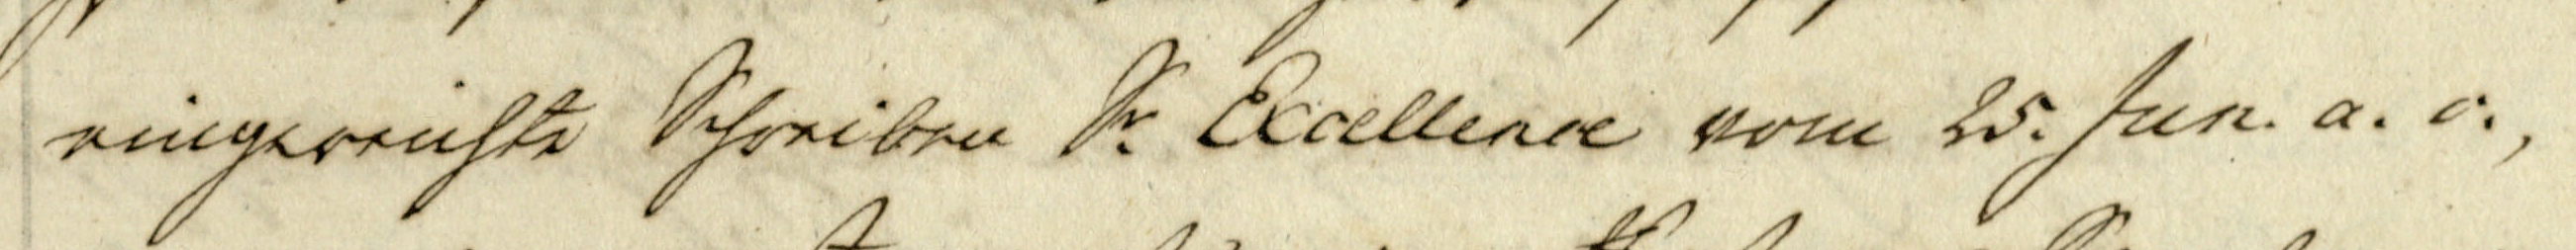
eingereichte Schreiben Sr. Excellence vom 25. Jun. a. c.,
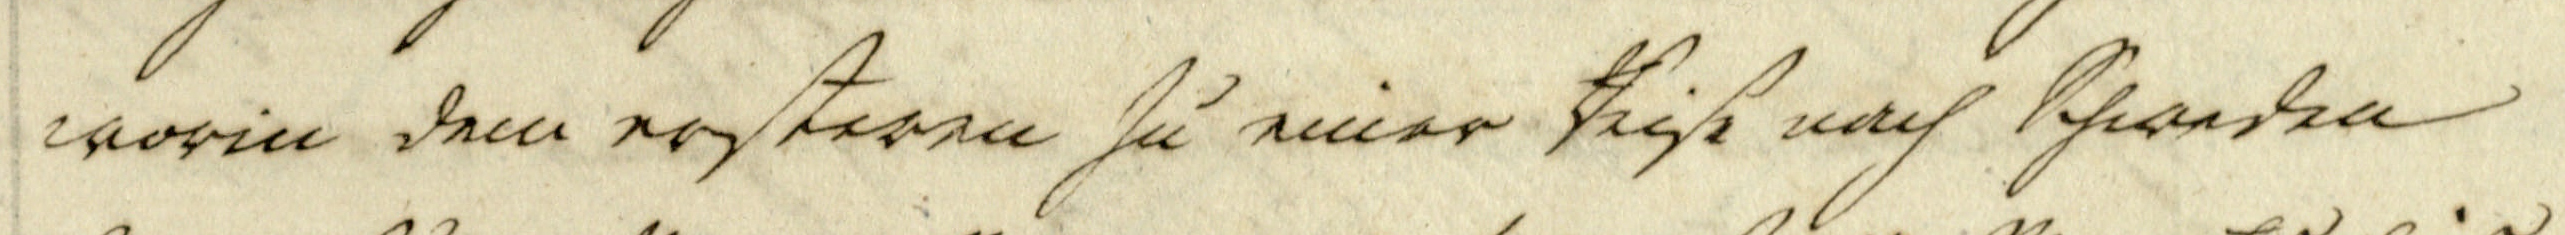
worin dem ersteren zu einer Reise nach Schweden
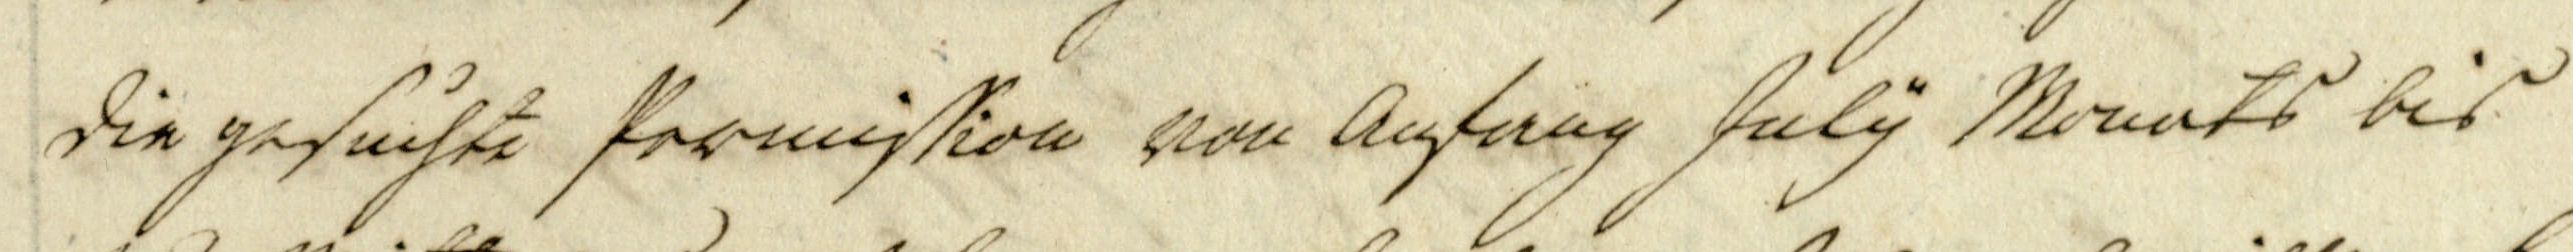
die gesuchte Permission von Anfang Julÿ Monats bis
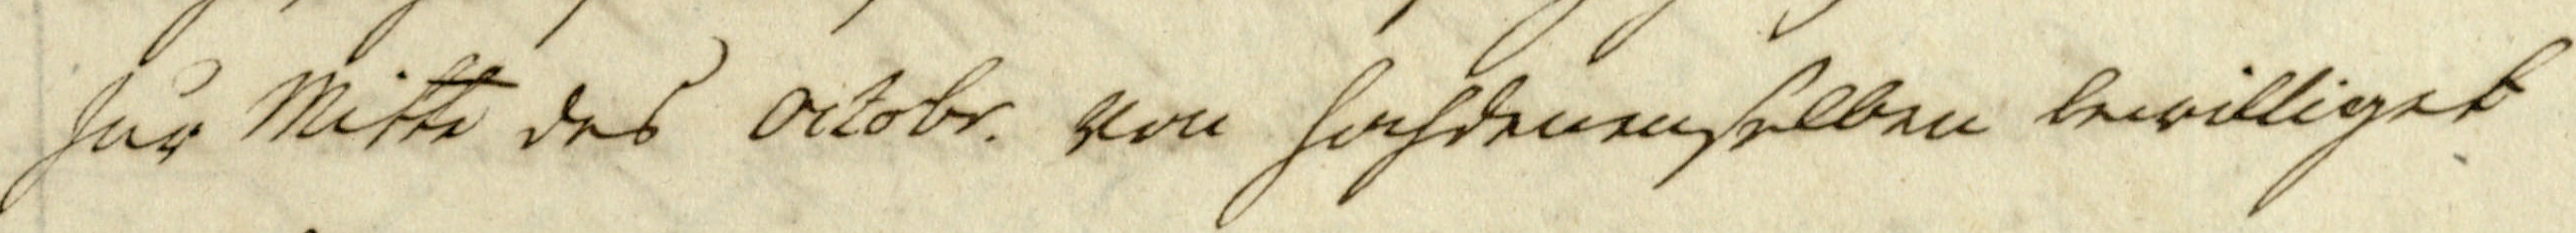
zur Mitte des Octobr. von hochdenenselben bewilliget
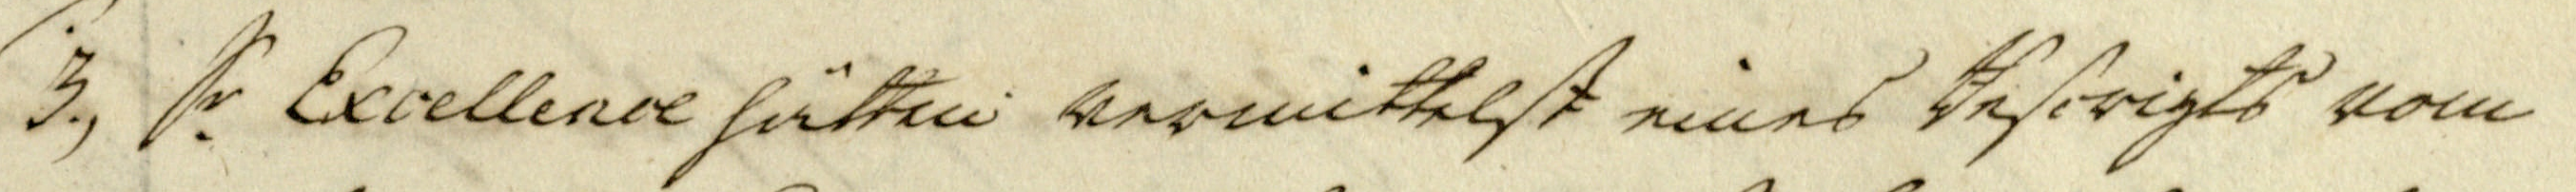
3., Sr. Excellence hätten vermittelst eines Rescripts vom
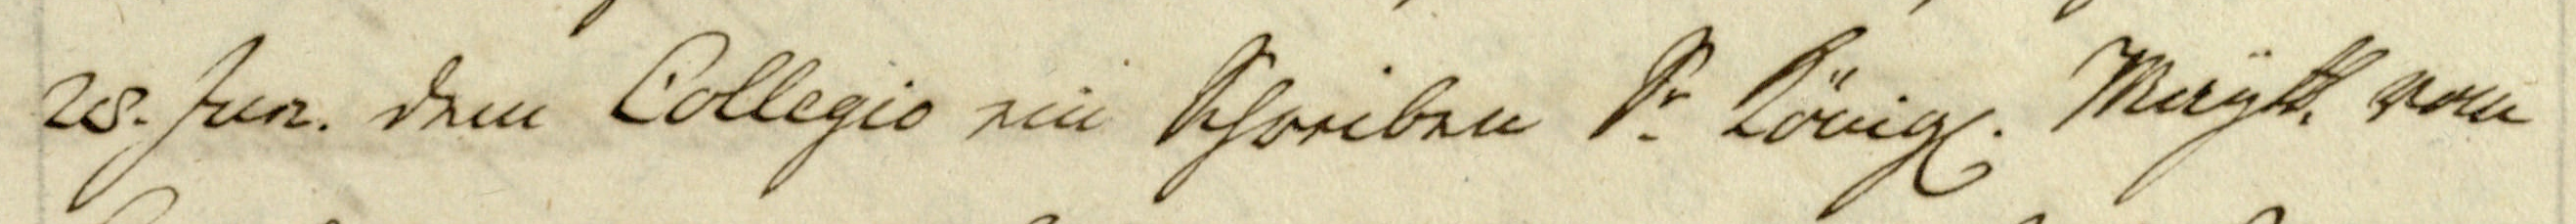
28. Jun. dem Collegio ein Schreiben seiner Königl. Maÿtt. vom
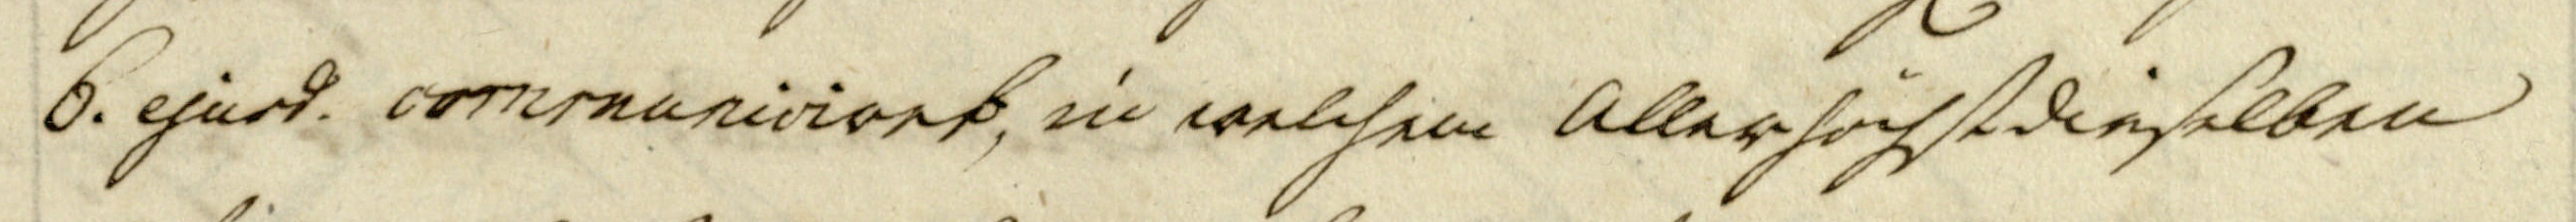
6. ejusd. communiciret, in welchem Allerhöchstdieselben
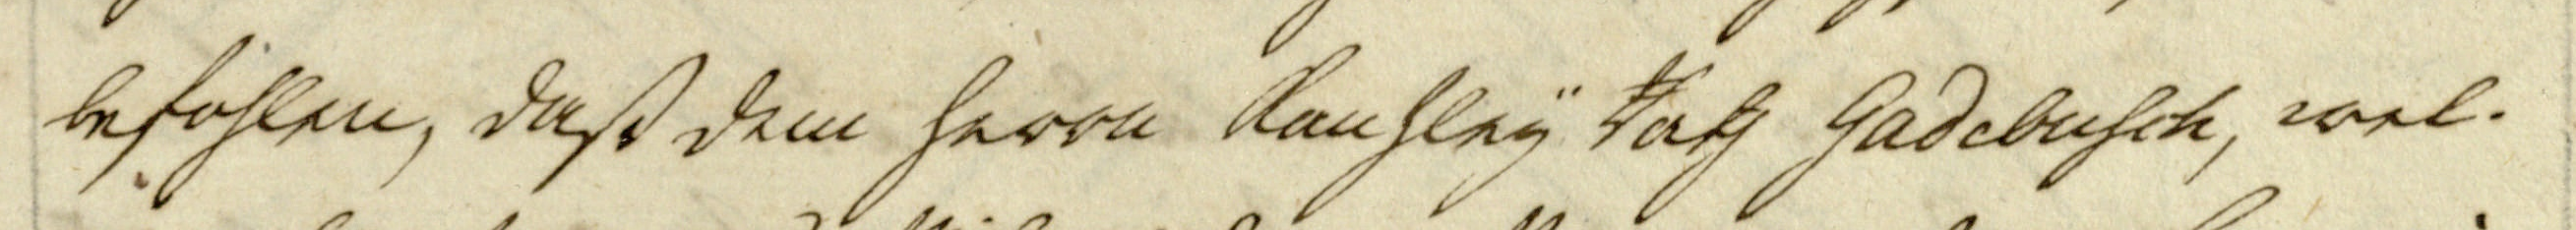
befohlen, daß dem herrn Kanzleÿ Rath Gadebusch, wel¬
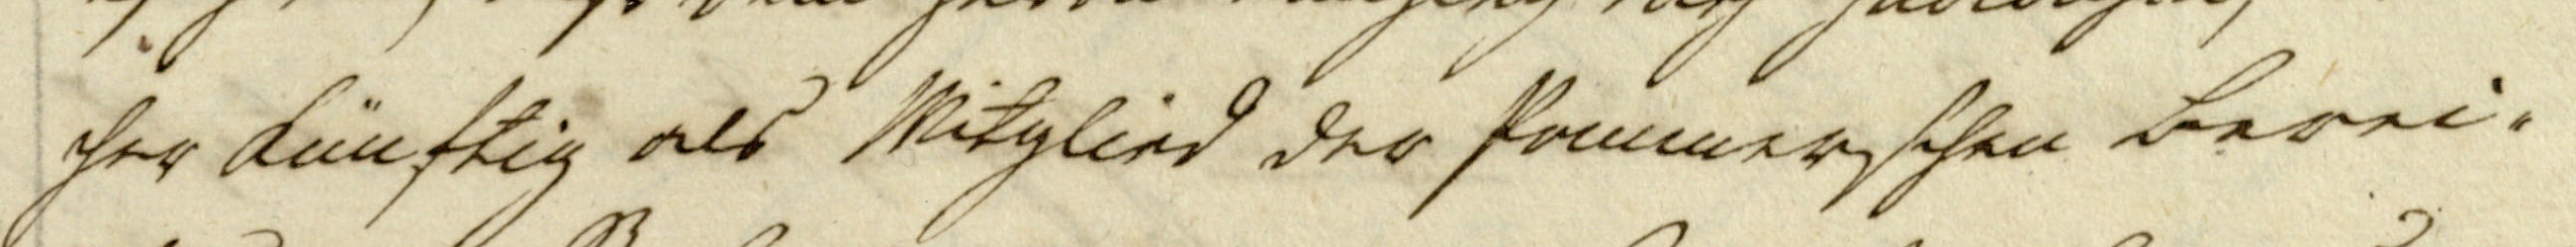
cher künftig als Mitglied der Pommerschen Berei¬
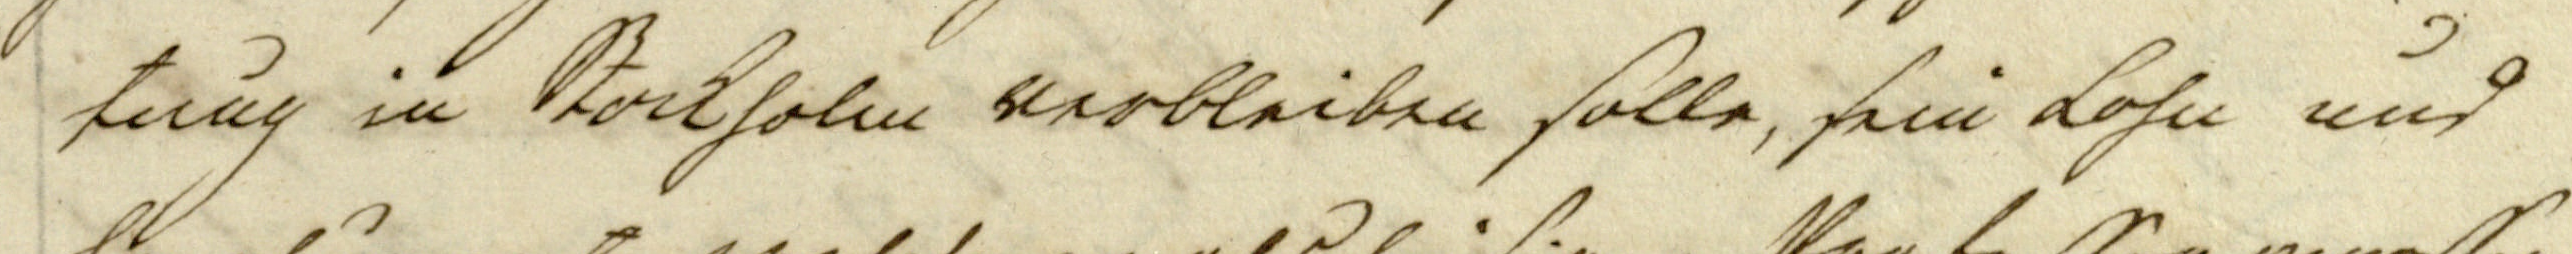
tung in Stockholm verbleiben solle, sein Lohn und
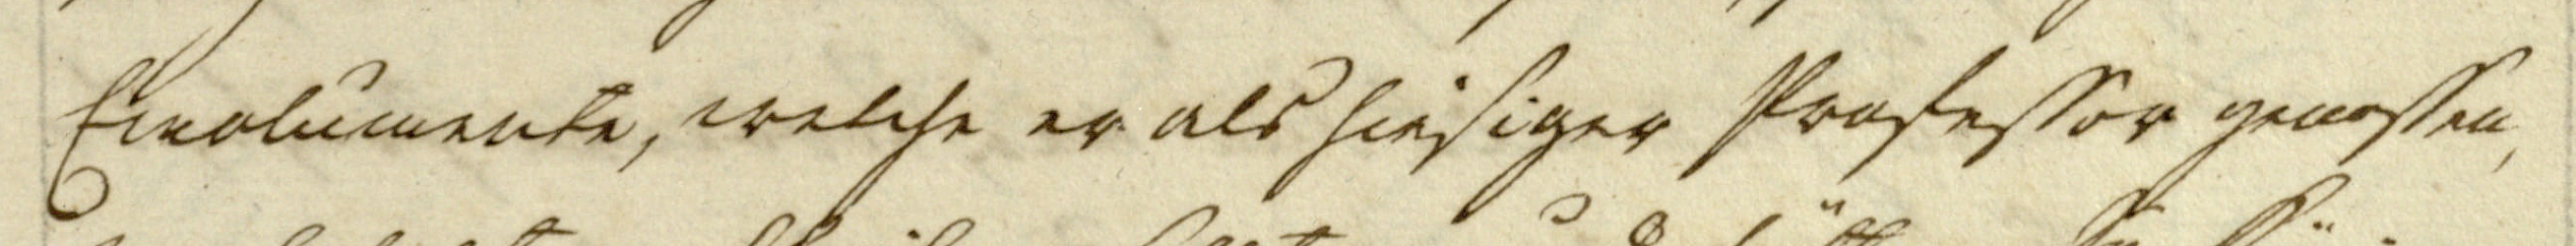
Emolumente, welche er als hiesiger Professor genossen,
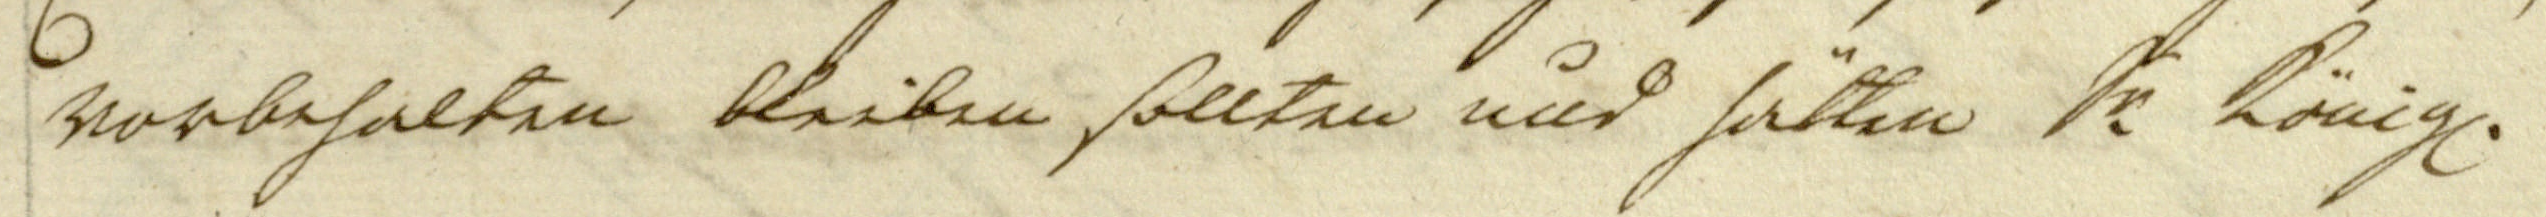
vorbehalten bleiben sollten und hätten Sr. Königl.
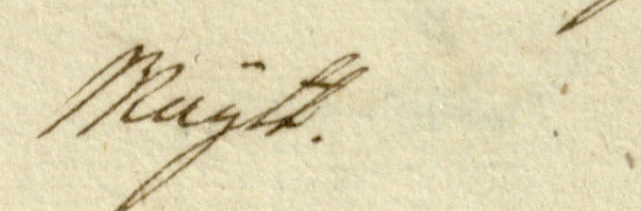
Maÿtt.
